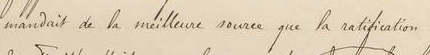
mandait de la meilleure source que la ratification
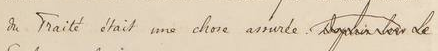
du Traité était une chose assurée. Depuis les Le
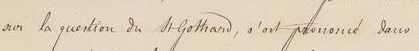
sur la question du St Gothard, s´est prononcé dans
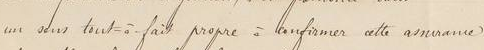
un sens tout-à-fait propre à confirmer cette assurance
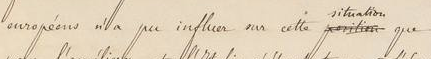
européens n'a pu influer sur cette positionsituation que
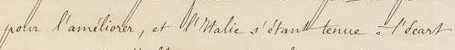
pour l´améliorer, et l´Italie, s´étant tenue à l´écart
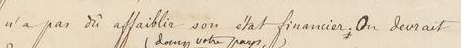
n´a pas dû affaiblir son état financier. On devrait
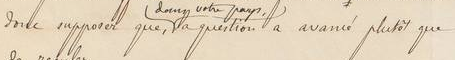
dans votre pays, la question a avancé plutôt que
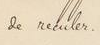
de reculer.
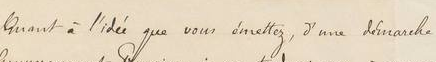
Quant à l´idée que vous émettez, d´une démarche
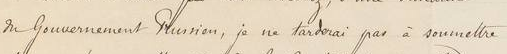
du Gouvernement Prussien, je ne tarderai pas à soumettre
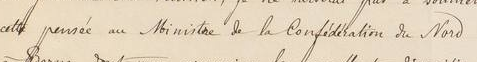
cette pensée au Ministre de la Confédération du Nord
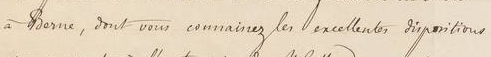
à Berne, dont vous connaissez les excellentes dispositions
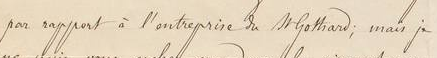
par rapport à l´entreprise du St Gothard; mais je
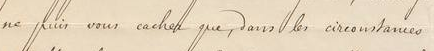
ne puis vous cacher que, dans les circonstances
